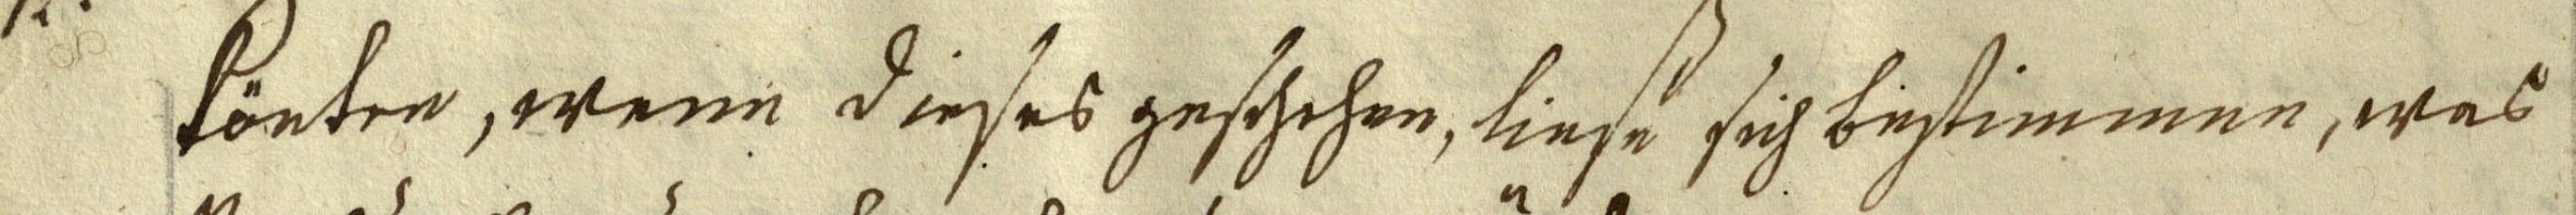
könten, wenn dieses geschehen, ließe sich bestimmen, was
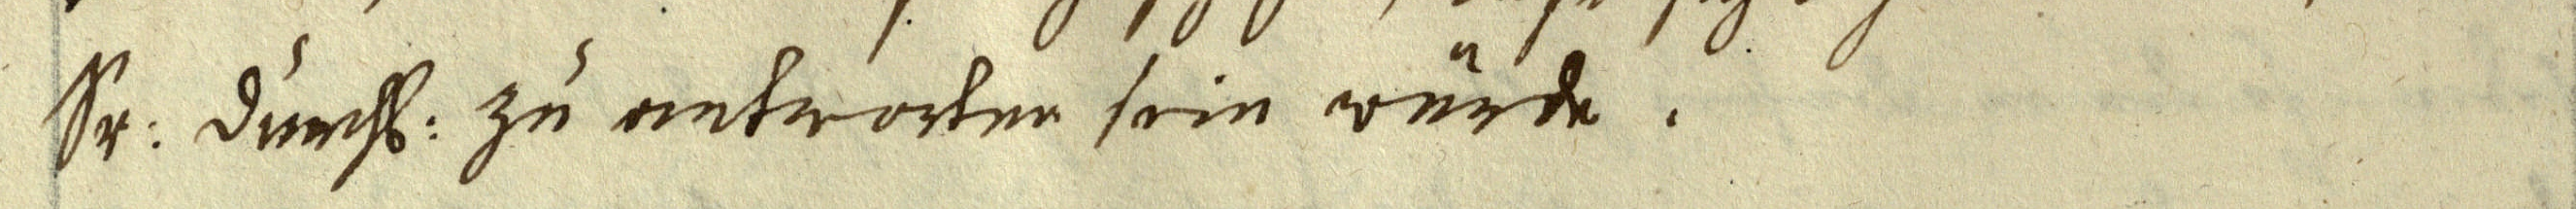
Sr: Durchl: zu antworten sein würde.
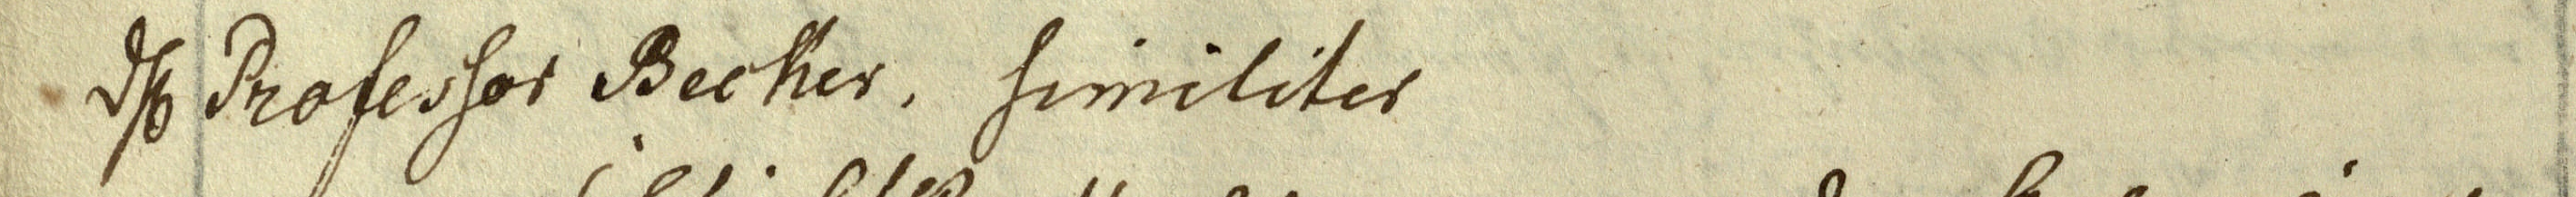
dh Professor Becker. similiter
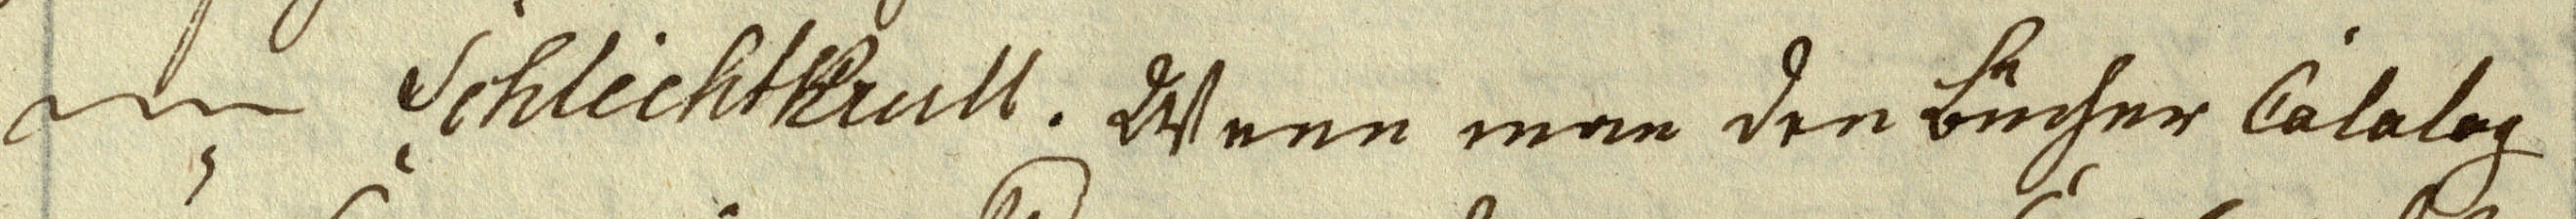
Schlichtkrull. Wenn man den Bücher Catalog
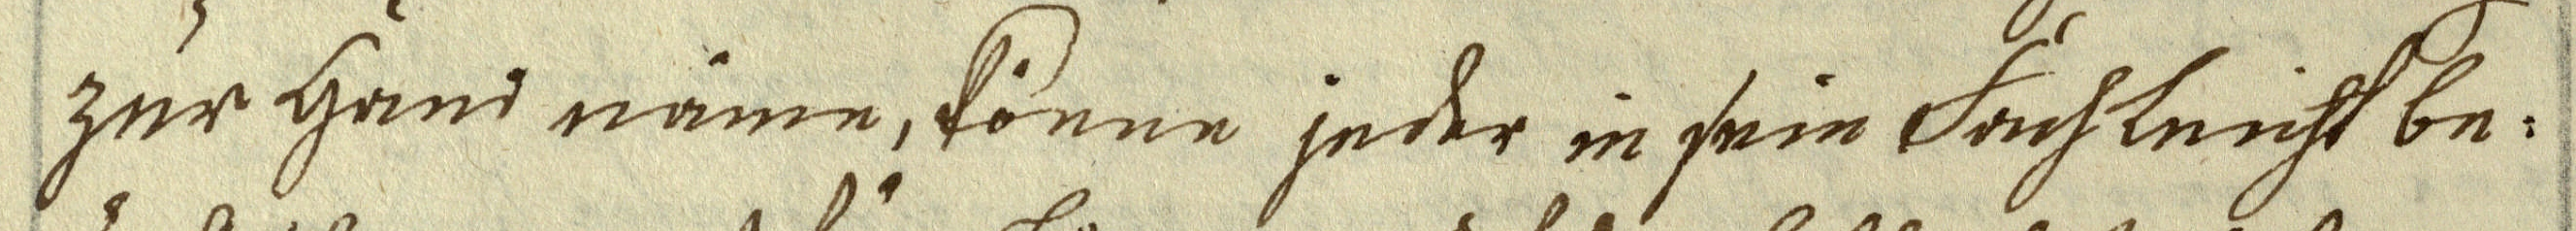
zur Hand näme, könne jeder in sein Fach leicht be¬
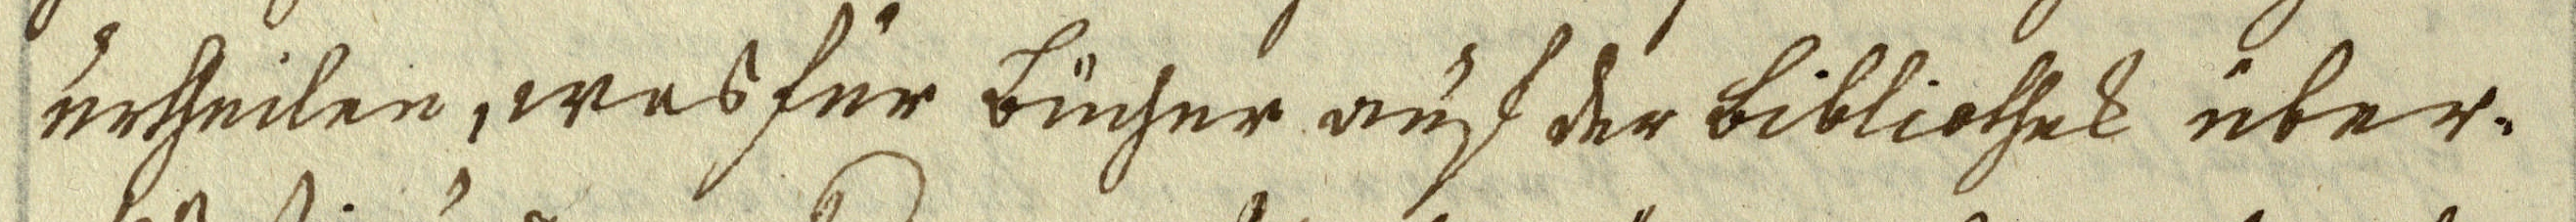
urtheilen, was für Bücher auf der Bibliothek über¬
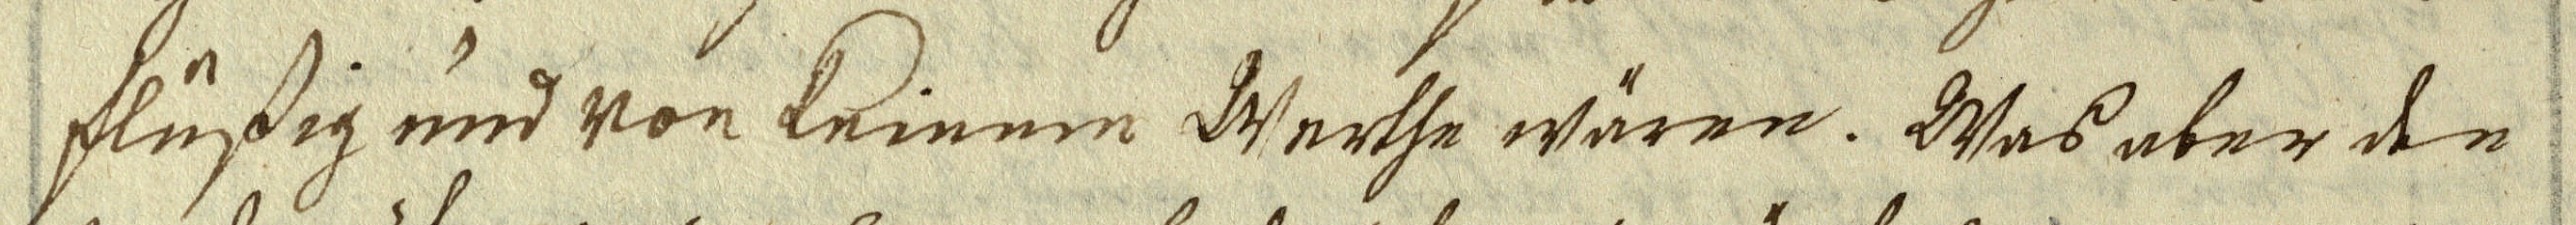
flüßig und von keinem Werthe wären. Was aber den
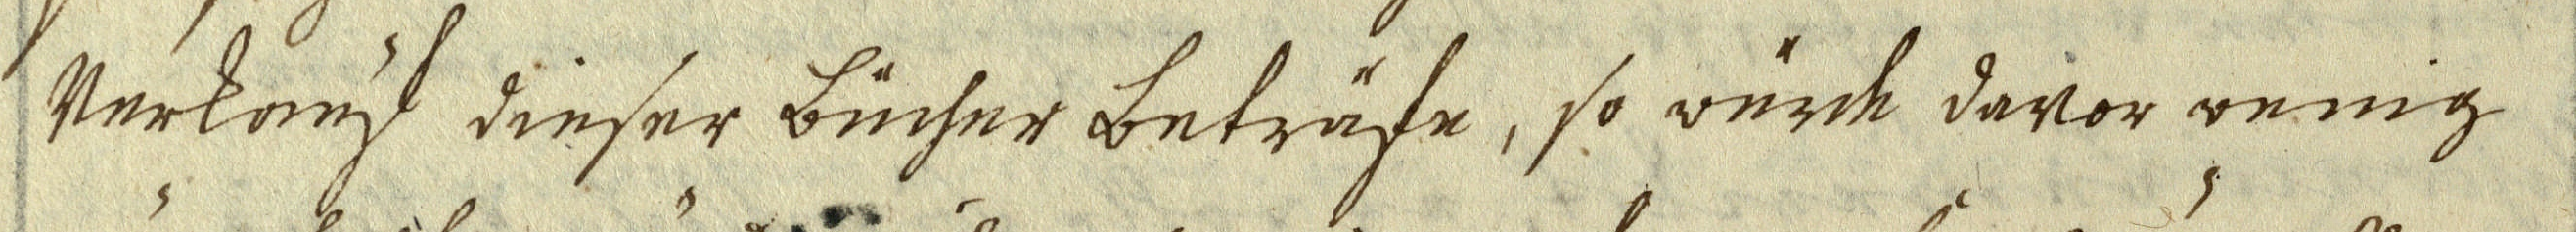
Verkauf dieser Bücher beträfe, so würde davor wenig
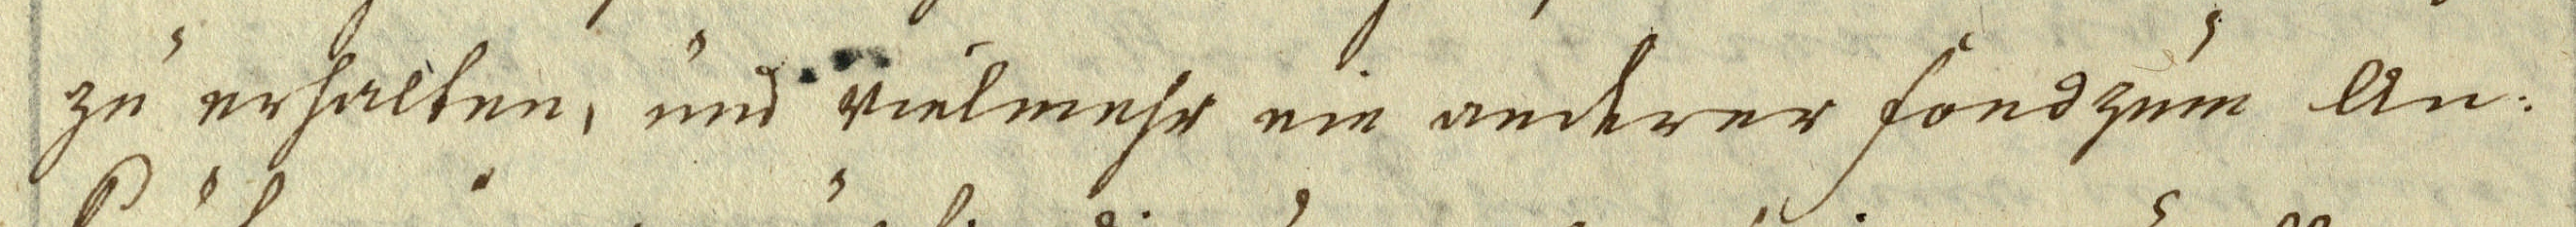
zu erhalten, und vielmehr ein anderer Fond zum An¬
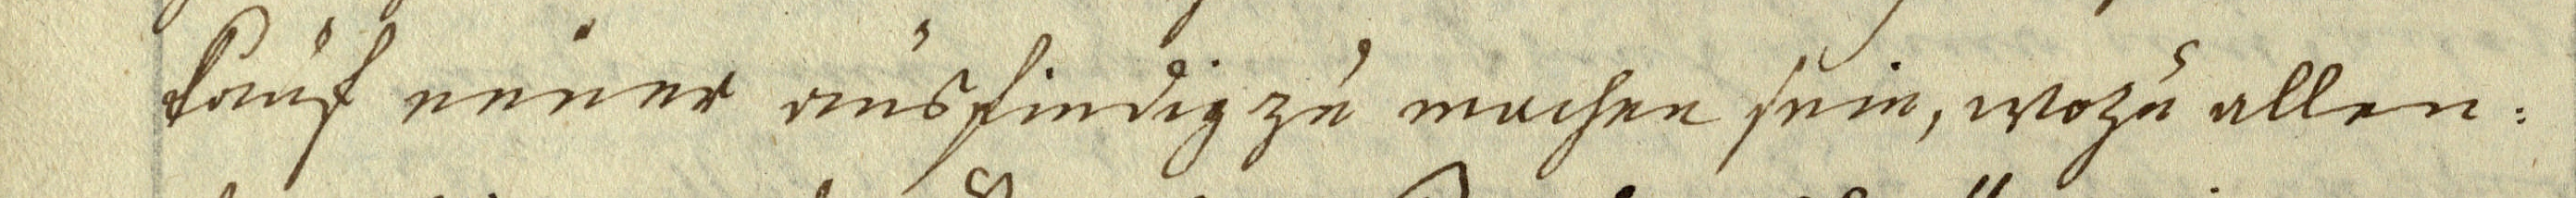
kauf neuer ausfindig zu machen sein, wozu allen¬
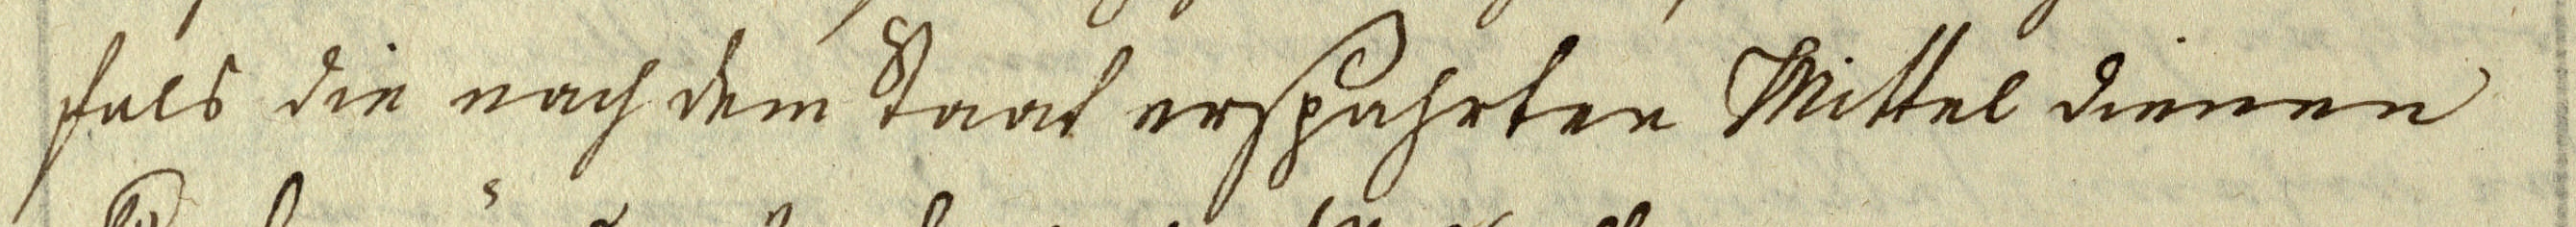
fals die nach dem Staat erspahrten Mittel dienen
